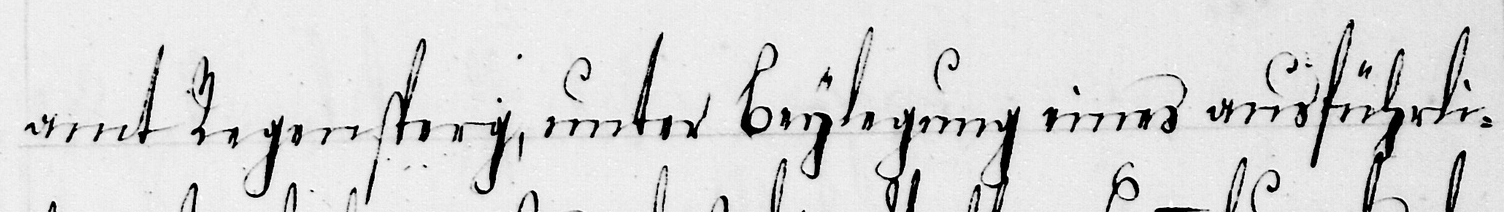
amt Regensperg, unter Beylegung eines ausführli¬
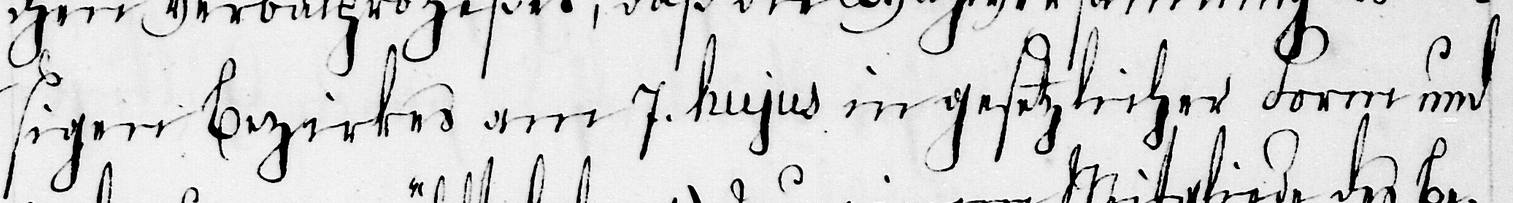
sigen Bezirkes am 7. hujus in gesetzlicher Form und
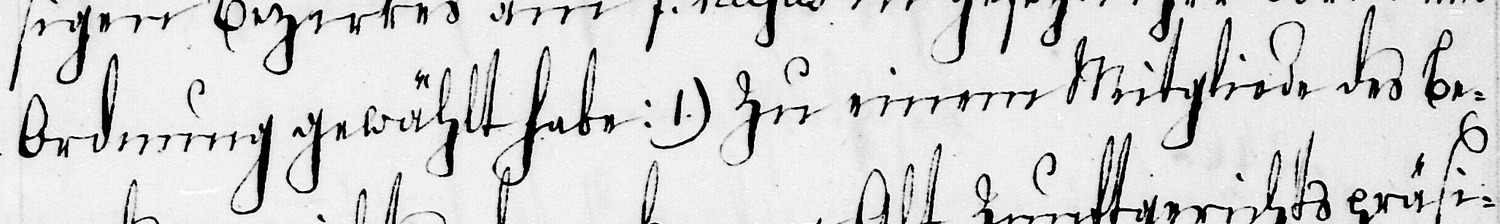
Ordnung gewählt habe: 1.) Zu einem Mitgliede des Be¬
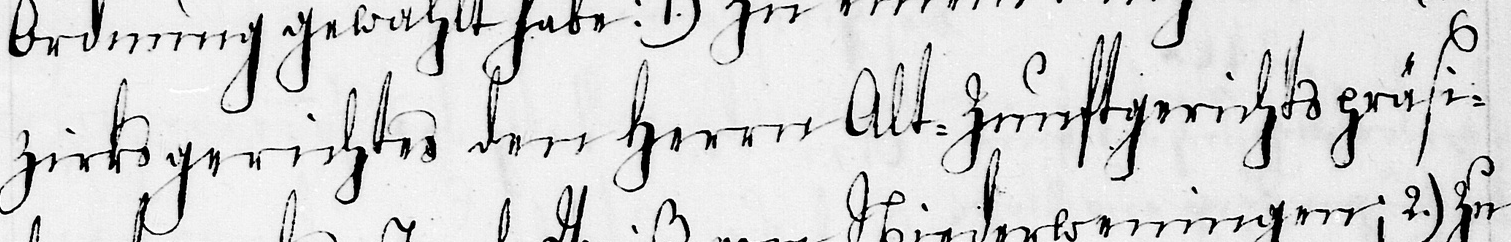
zirksgerichtes den Herrn Alt-Zunftgerichtspräsi¬
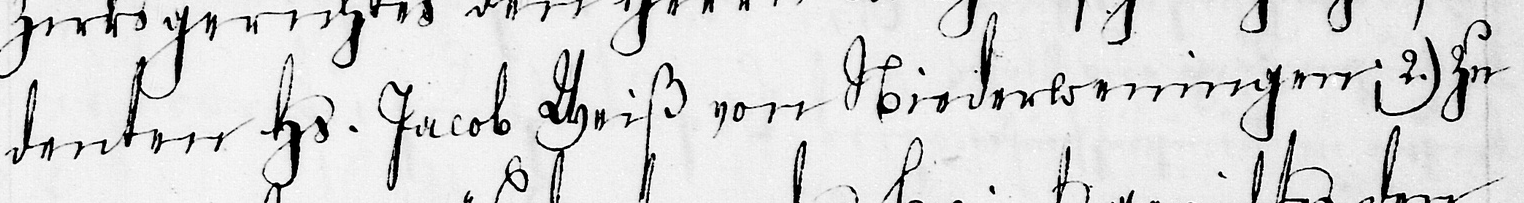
denten Hs. Jacob Weiß von Niederweningen; 2.) Zu
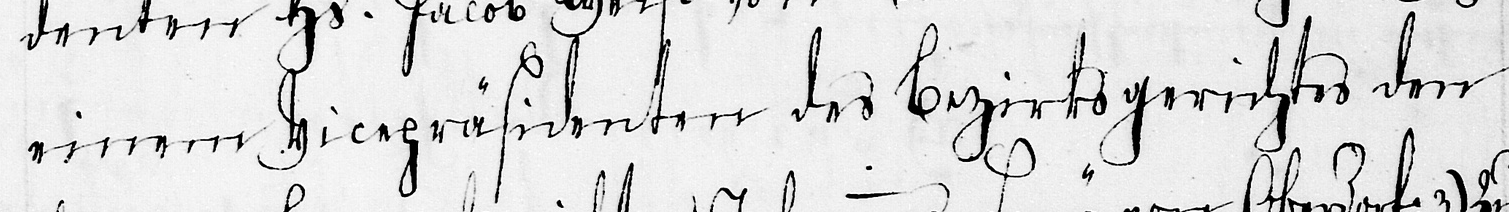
einem Vicepräsidenten des Bezirksgerichtes den
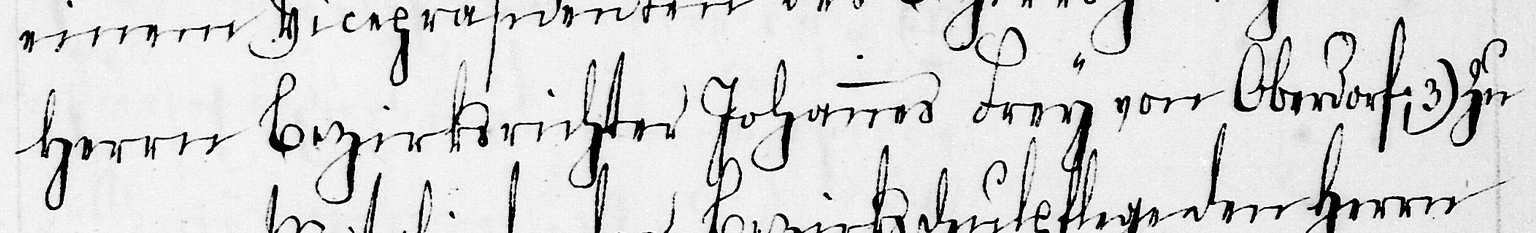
Herrn Bezirksrichter Johannes Frey von Oberdorf; 3) Zu
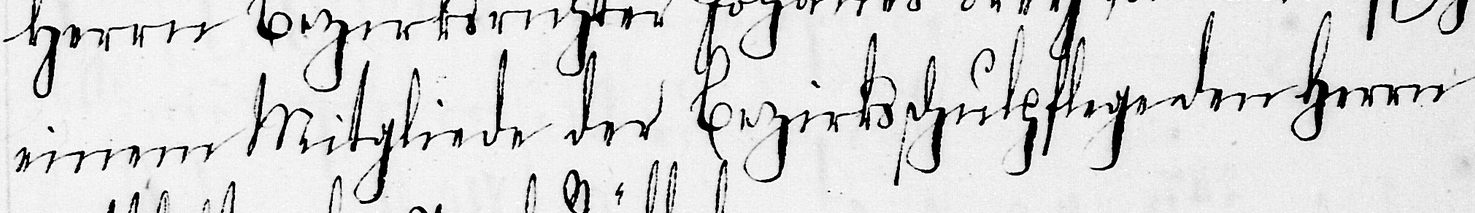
einem Mitgliede der Bezirksschulpflegen den Herrn
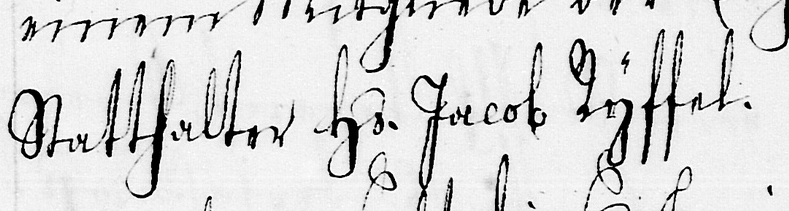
Statthalter Hs. Jacob Ryffel.
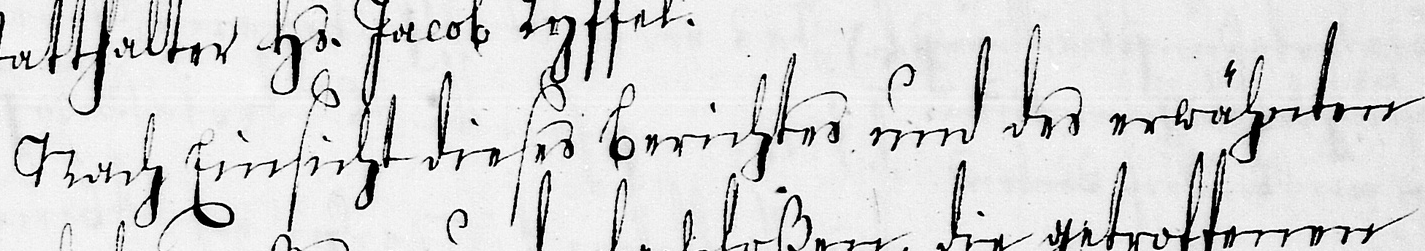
Nach Einsicht dieses Berichtes und des erwähnten
